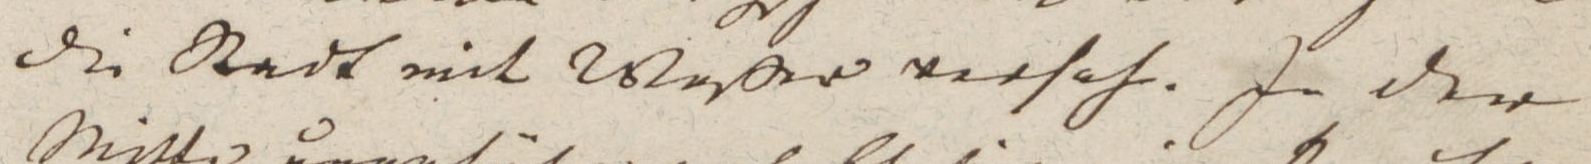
die Stadt mit Wasser versah. In der
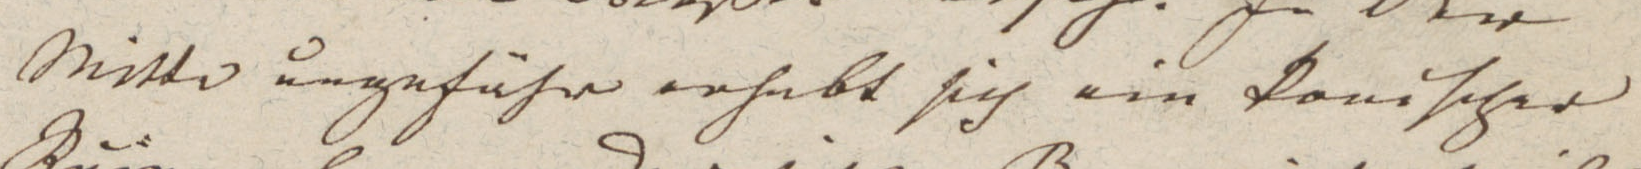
Mitte ungefähr erhebt sich ein konischer
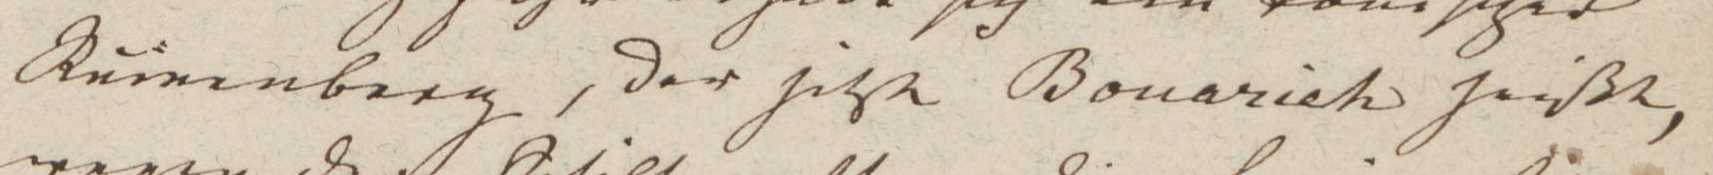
Ruinenberg, der jetzt Bouarieh heisst,
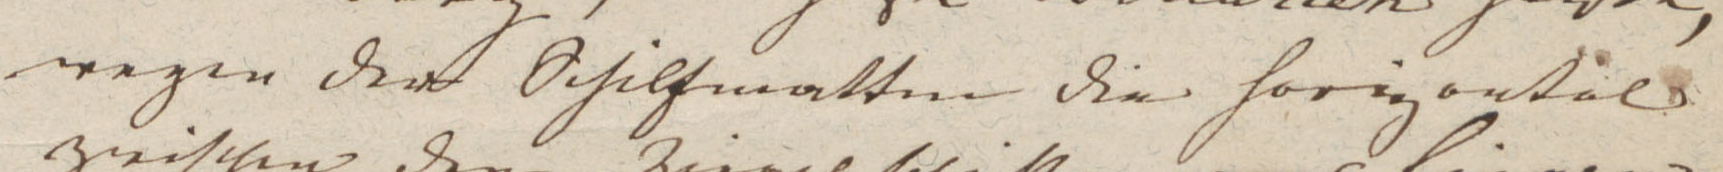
wegen der Schilfmatten die horizontal
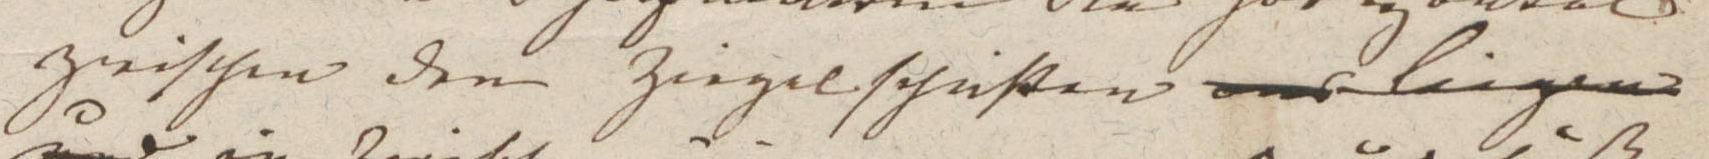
zwischen den Ziegelschichten aus liegen
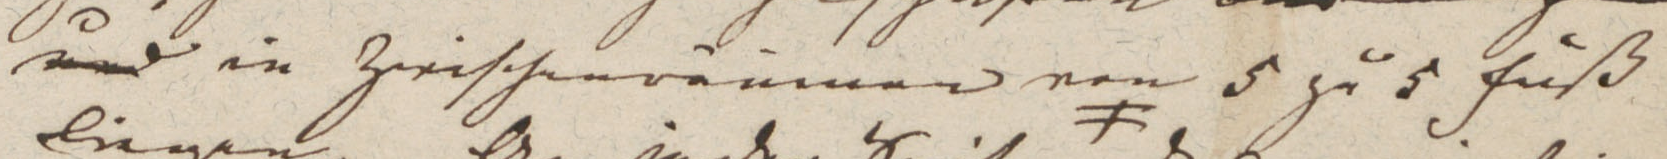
und in Zwischenräumen von 5 zu 5 Fuss
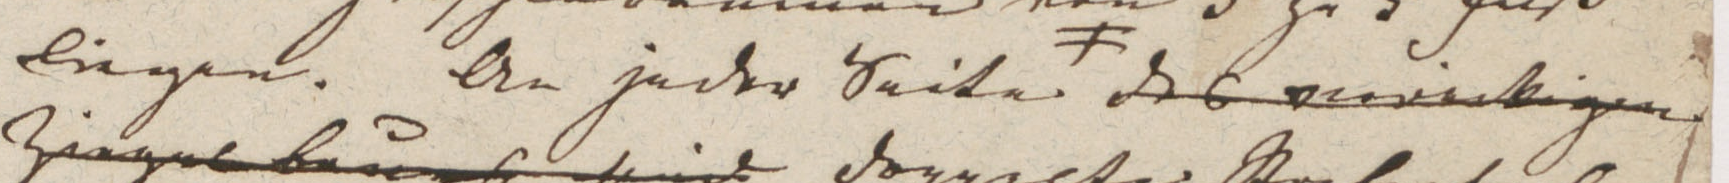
liegen. An jeder Seite % des viereckigen
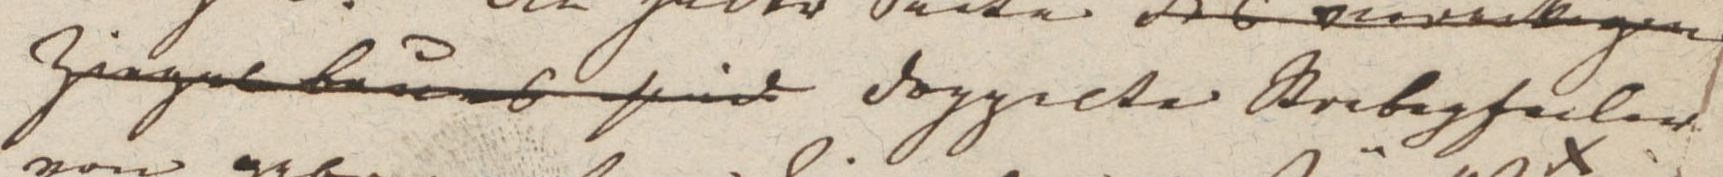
Ziegelbaues sind doppelte Strebepfeiler
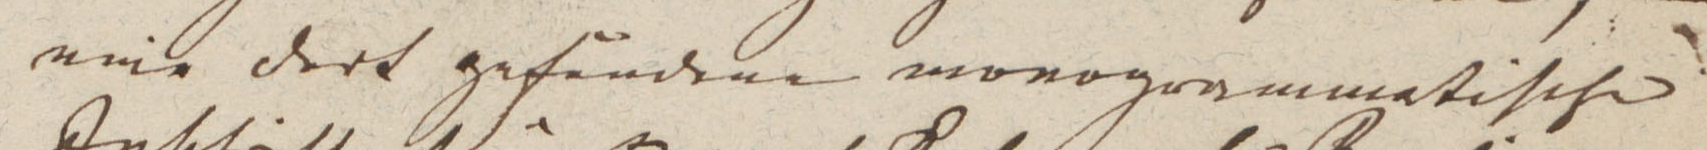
eine dort gefundene monogrammatische
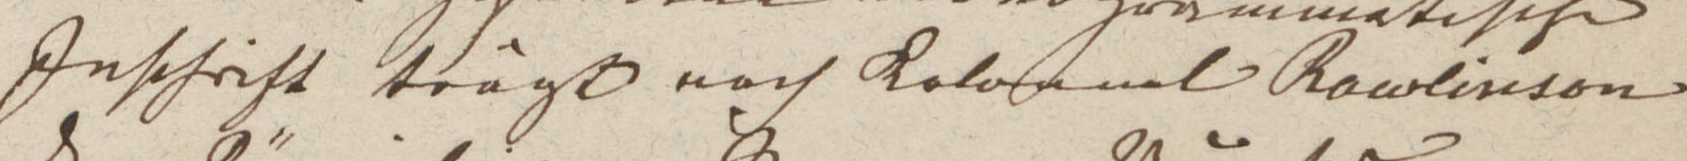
Inschrift trägt nach Kolonell Rawlinson
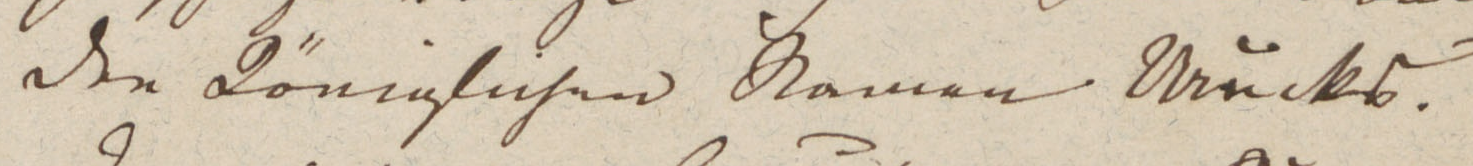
den Königlichen Namen Urucks.
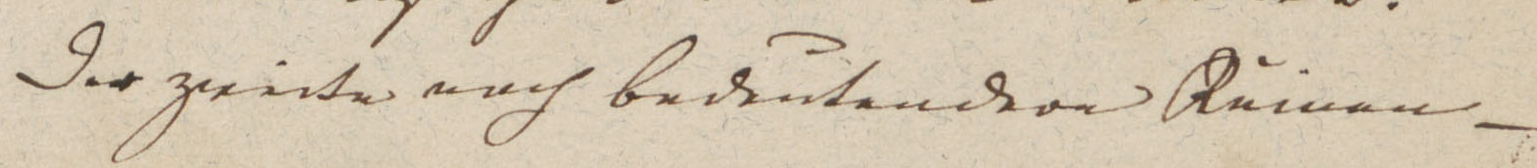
Der zweite noch bedeutendere Ruinen-
